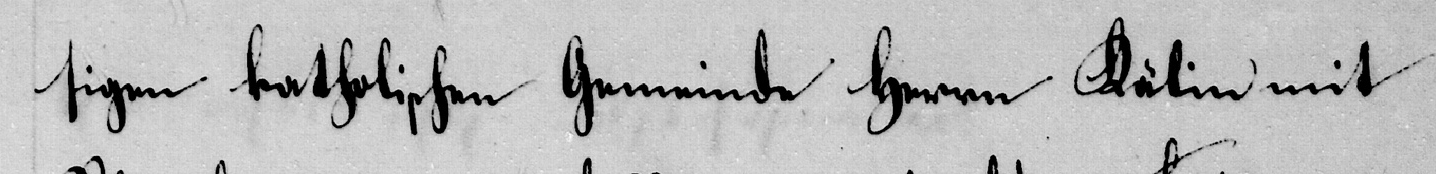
sigen katholischen Gemeinde Herrn Kälin mit
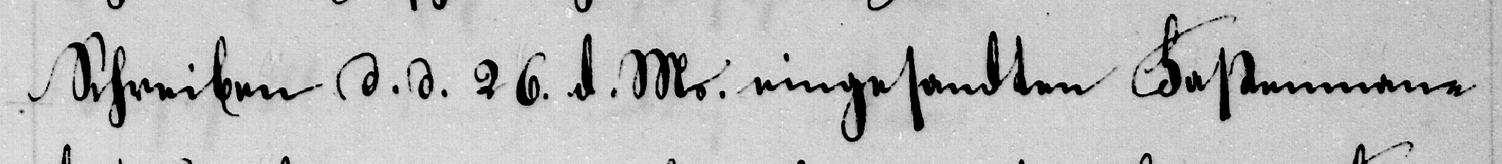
Schreiben d. d. 26. d. Ms. eingesandten Fastenman¬
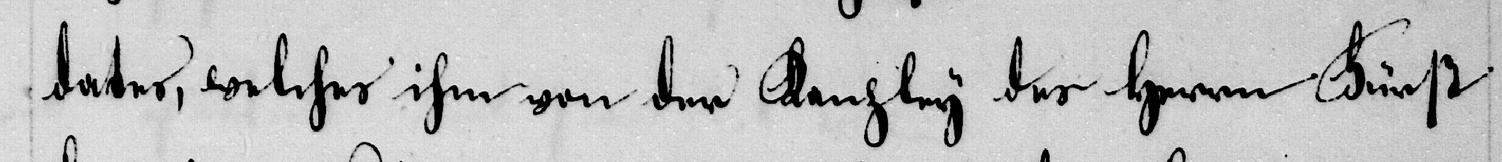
dates, welches ihm von der Kanzley des Herrn Fürst
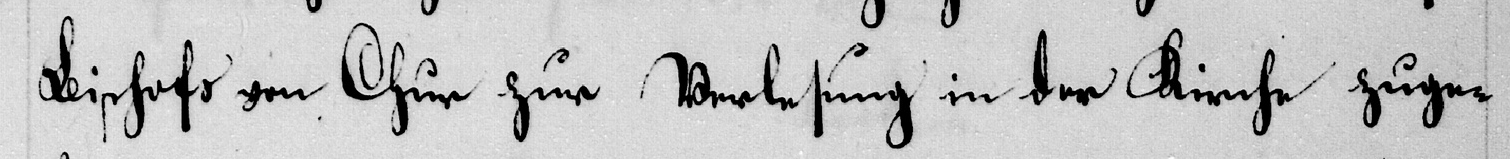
Bischofs von Chur zur Verlesung in der Kirche zuge¬
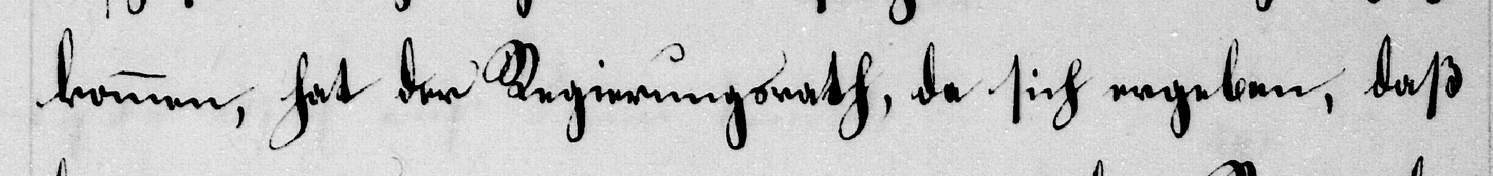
kommen, hat der Regierungsrath, da sich ergeben, daß
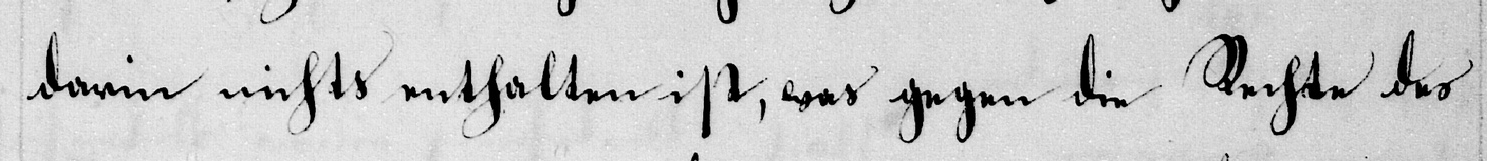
darin nichts enthalten ist, was gegen die Rechte des
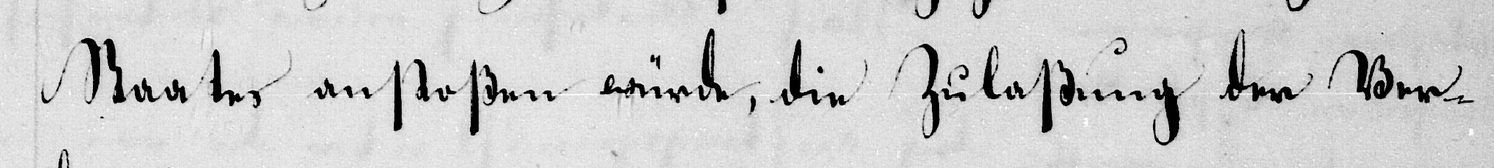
Staates anstoßen würde, die Zulaßung der Ver¬
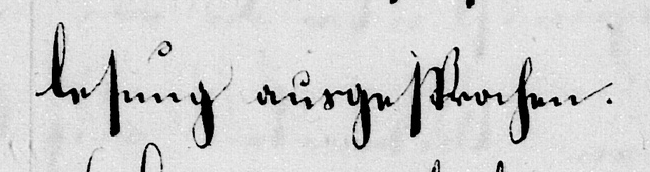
lesung ausgesprochen.
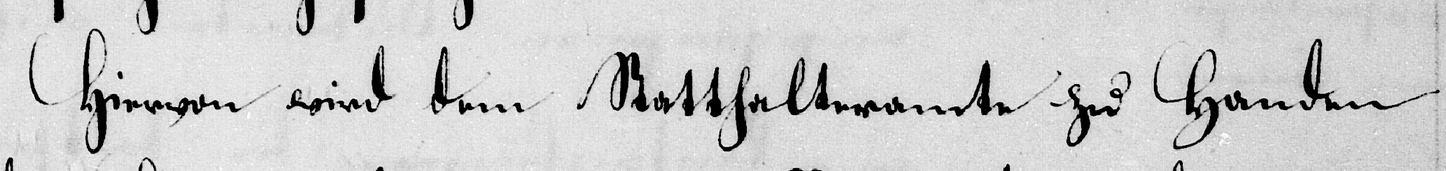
Hiervon wird dem Statthalteramte zu Handen
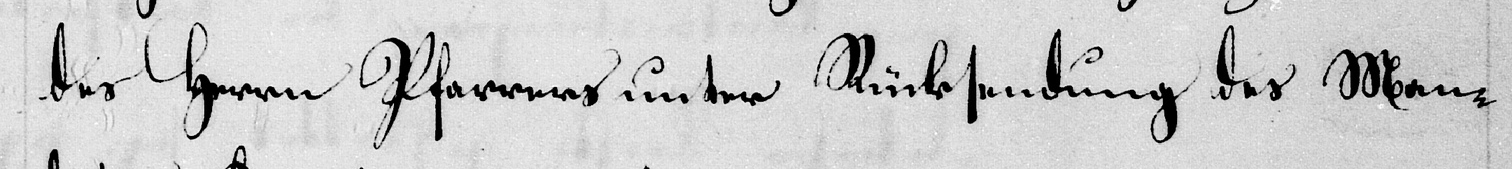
des Herrn Pfarrers unter Rücksendung des Man¬
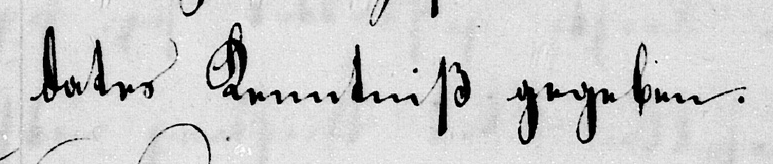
dates Kenntniß gegeben.
